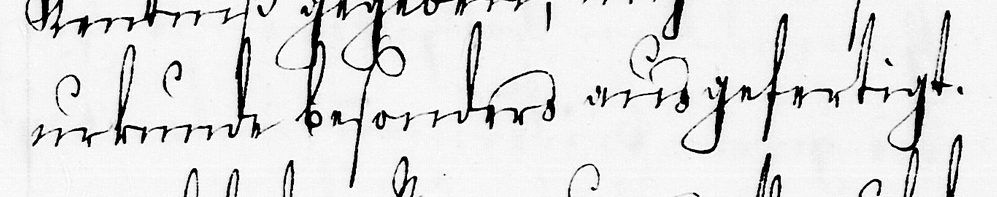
urkunde besonders ausgefertigt.
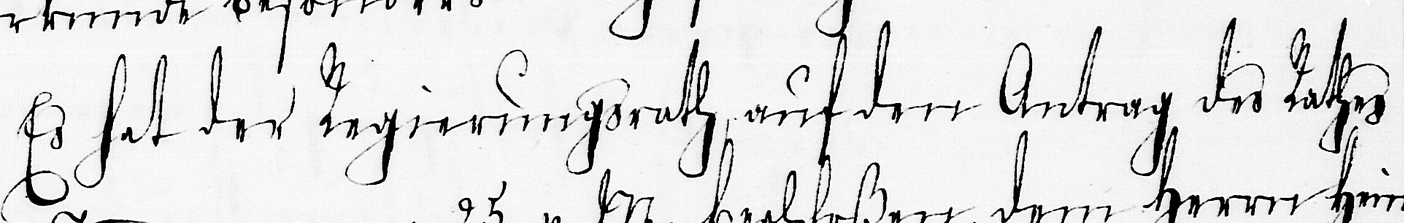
Es hat der Regierungsrath auf den Antrag des Rathes
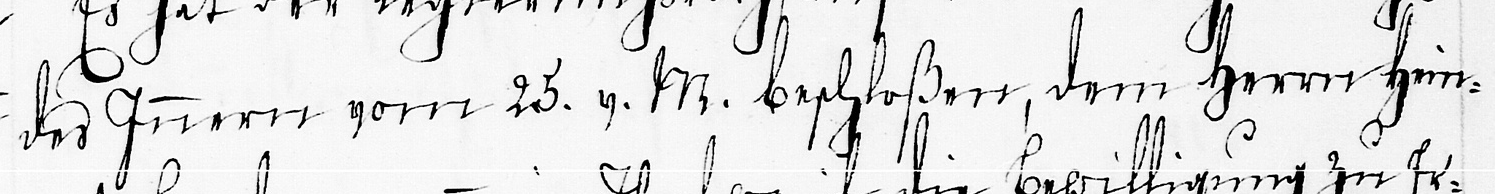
des Innern vom 25. v. M. beschloßen, dem Herrn Hein¬
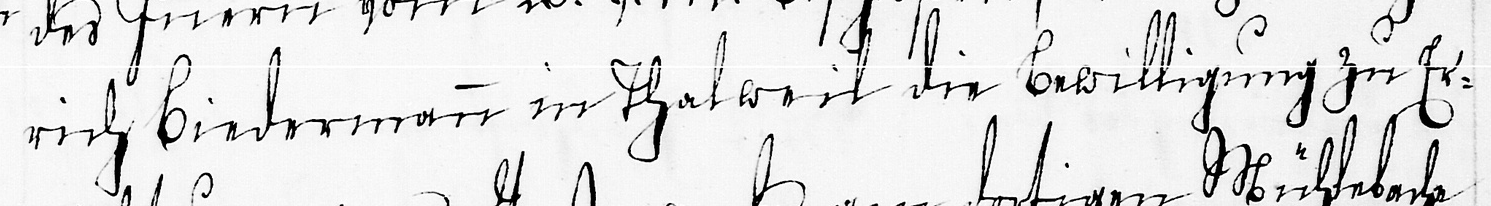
rich Biedermann in Thalweil die Bewilligung zu Er¬
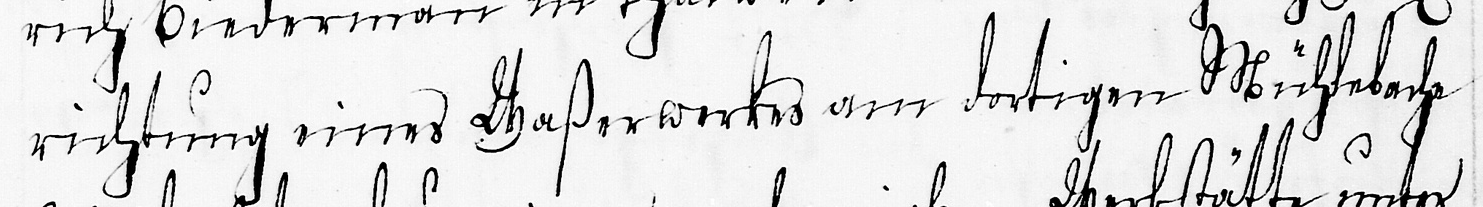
richtung eines Waßerwerkes am dortigen Mühlebache
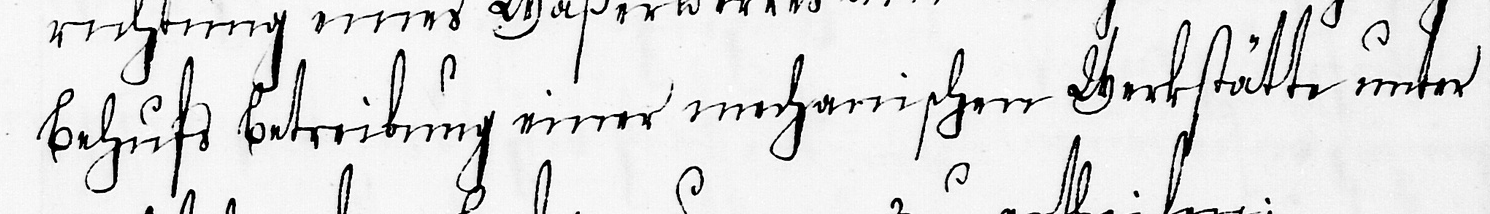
Behufs Betreibung einer mechanischen Werkstätte unter
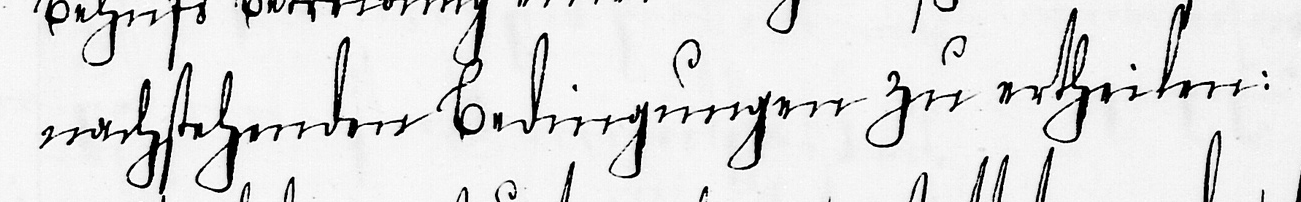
nachstehenden Bedingungen zu ertheilen:
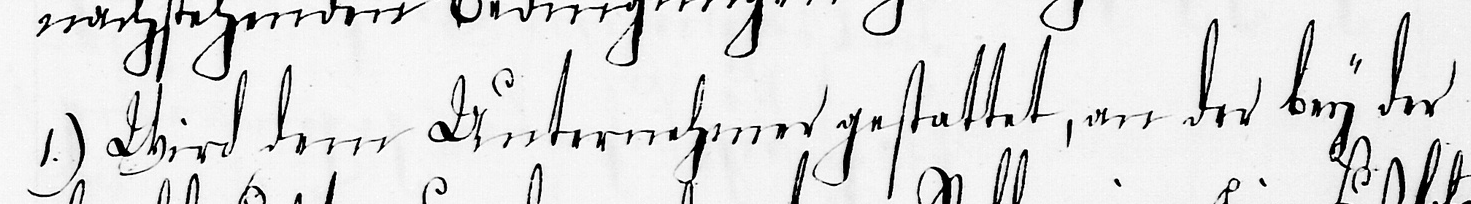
1.) Wird dem Unternehmer gestattet, an der bey der
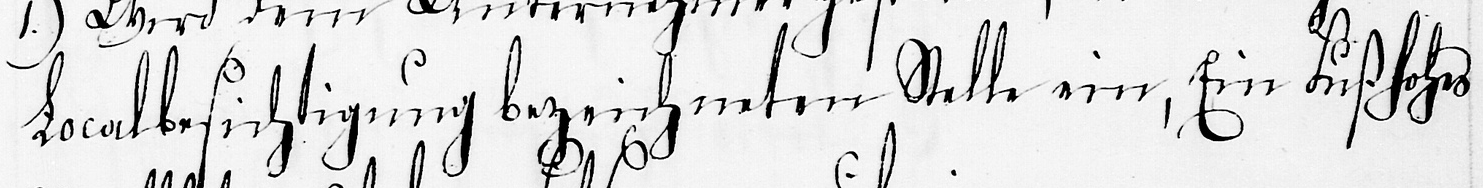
Localbesichtigung bezeichneten Stelle ein, Ein Fuß hohes
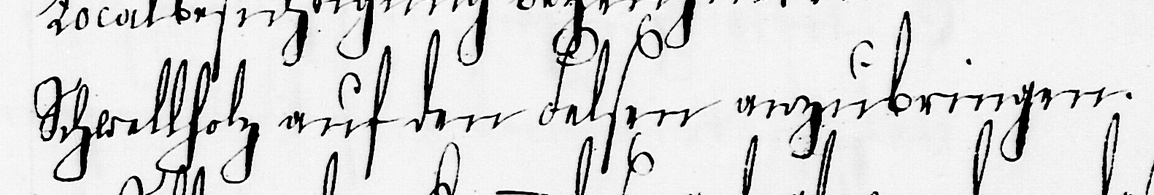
Schwellholz auf den Felsen anzubringen.
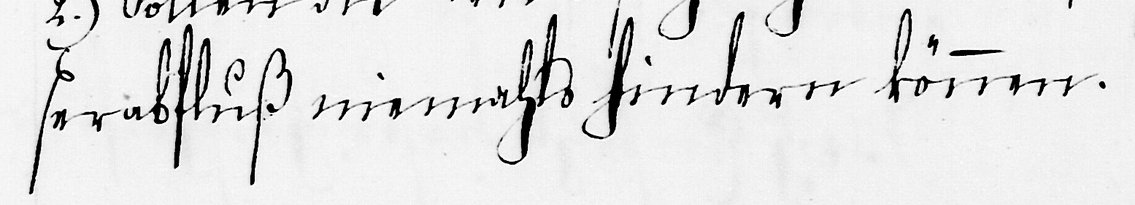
ßerabfluß niemahls hindern können.
